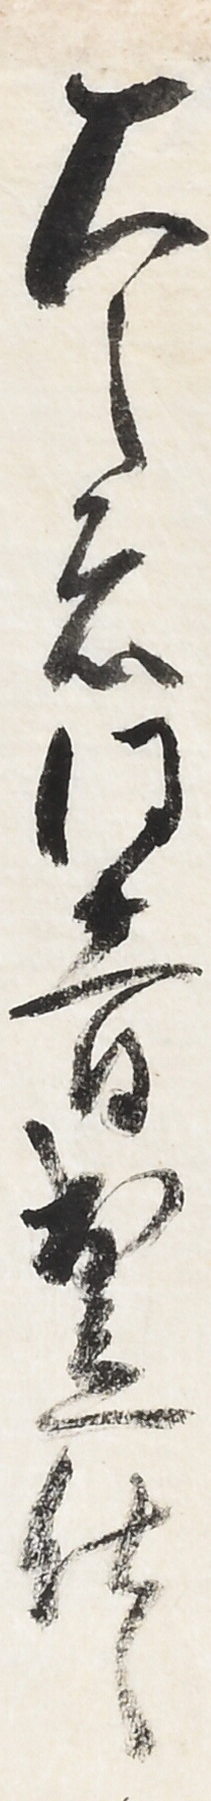右之者同十一日出立仕候
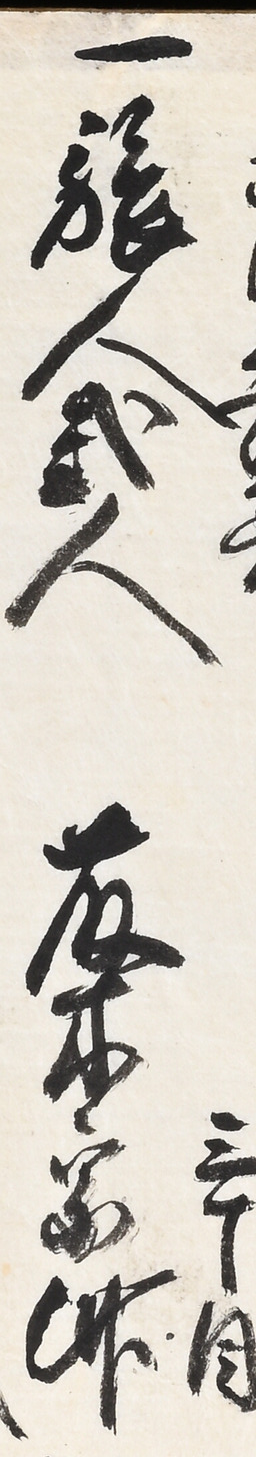一旅人弐人藤木家竹
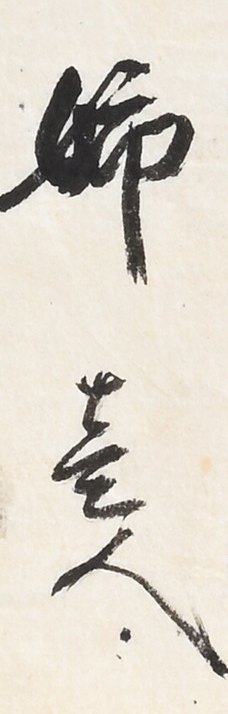姉壱人
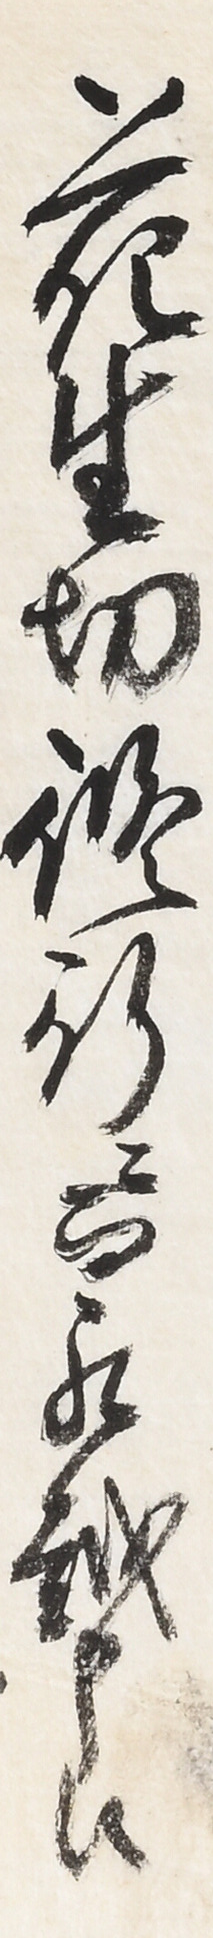花生切修行ニ而罷越申候
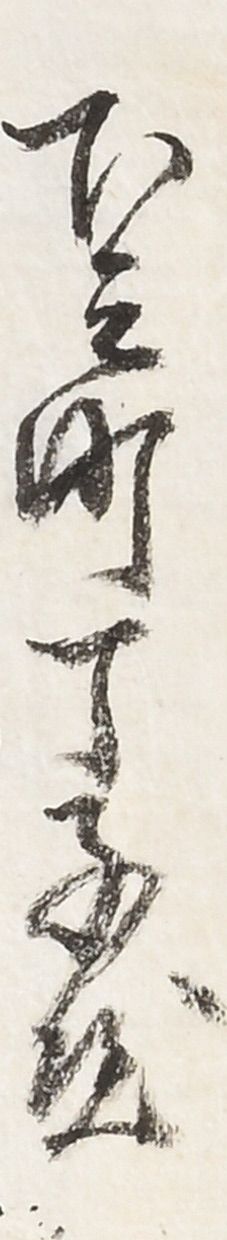下モ町丁子屋
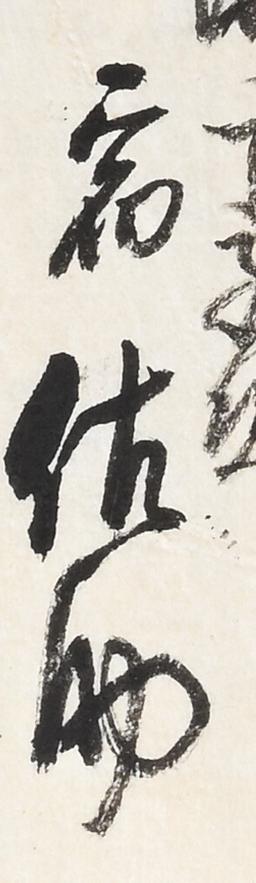宿佐助
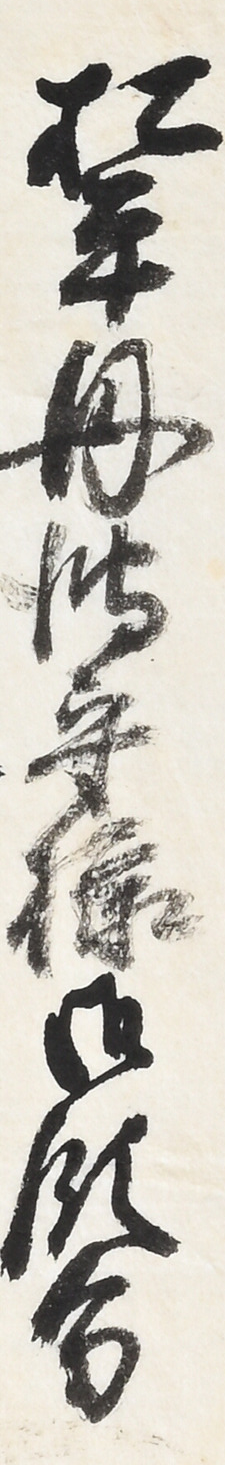松本丹波守様御領分
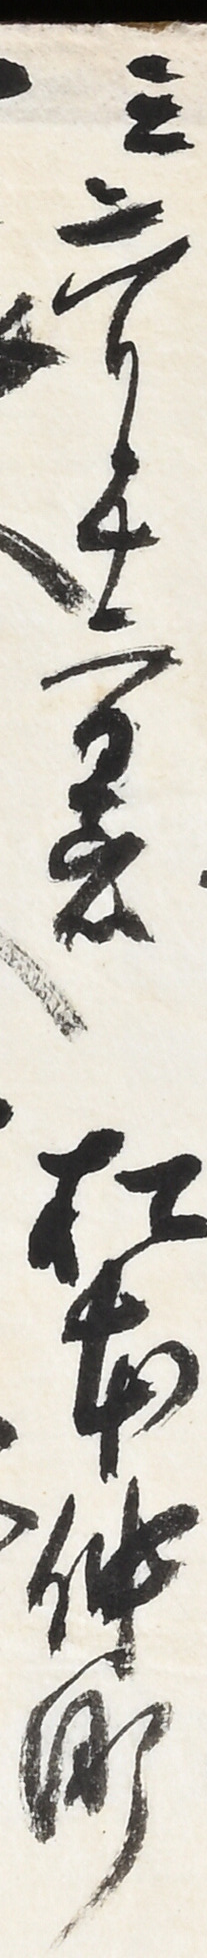壬六月十二日着松本仲町
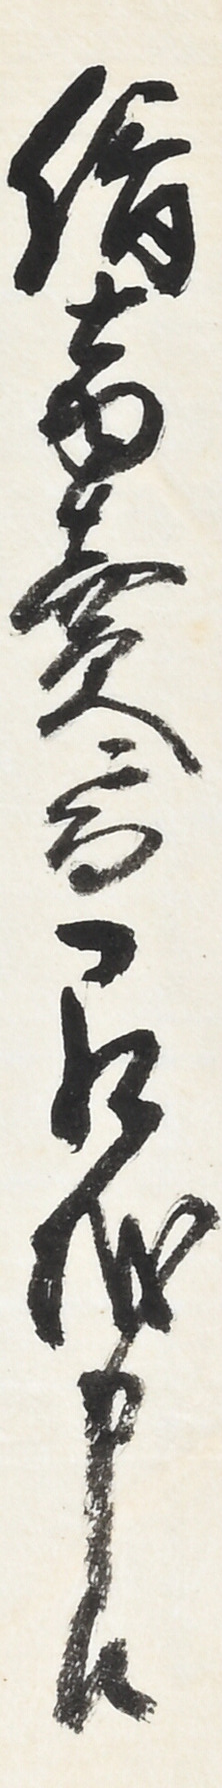絹商売ニ而罷越申候
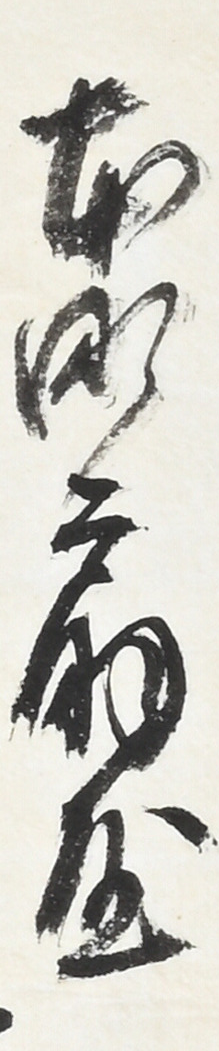本町扇屋
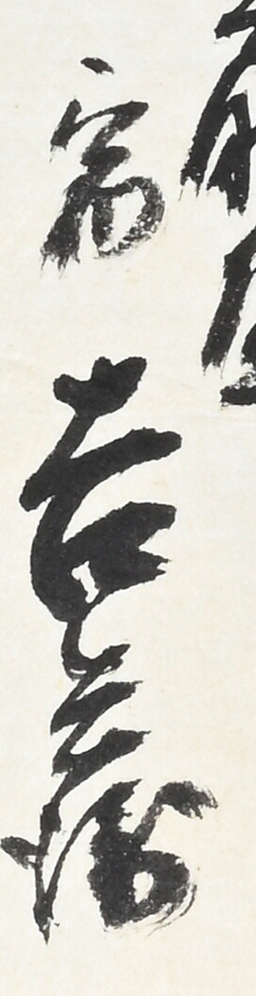宿吉兵衛
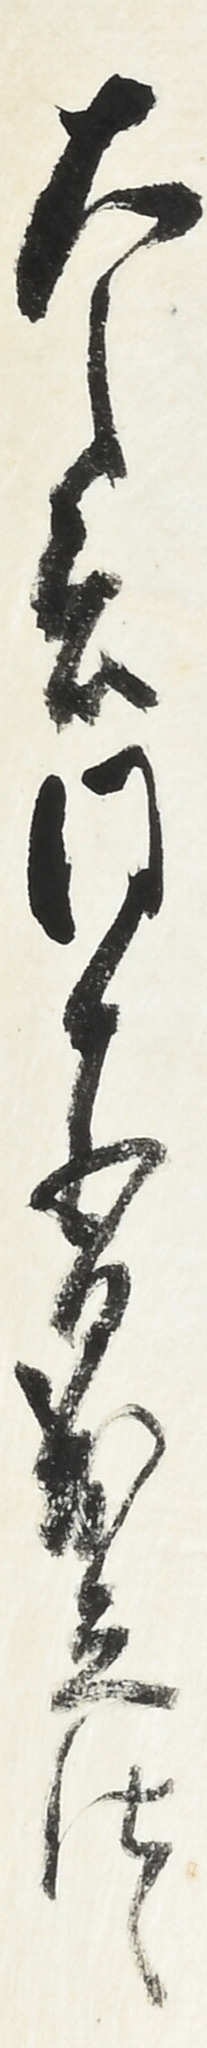右之者同十五日出立仕候
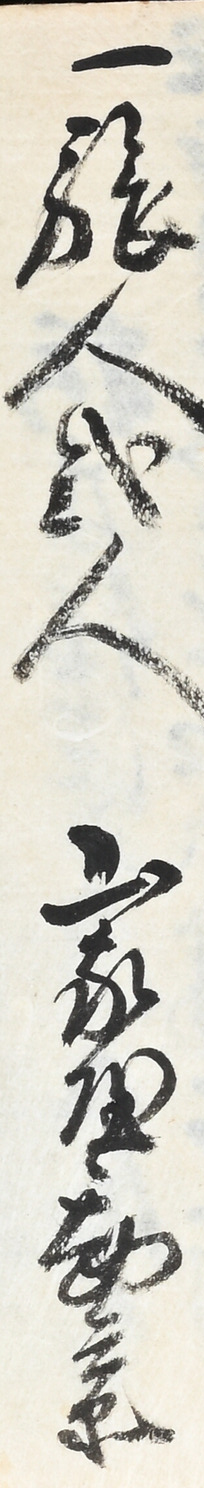一旅人壱人大森屋治兵衛

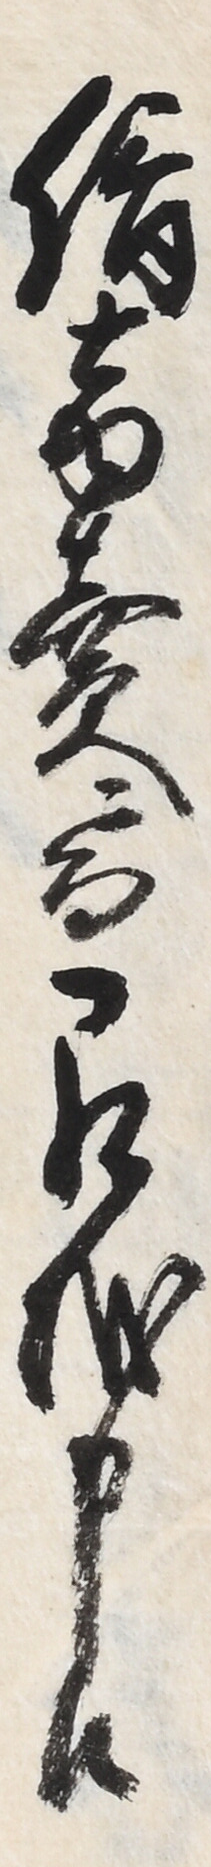薬種商売ニ而罷越申候
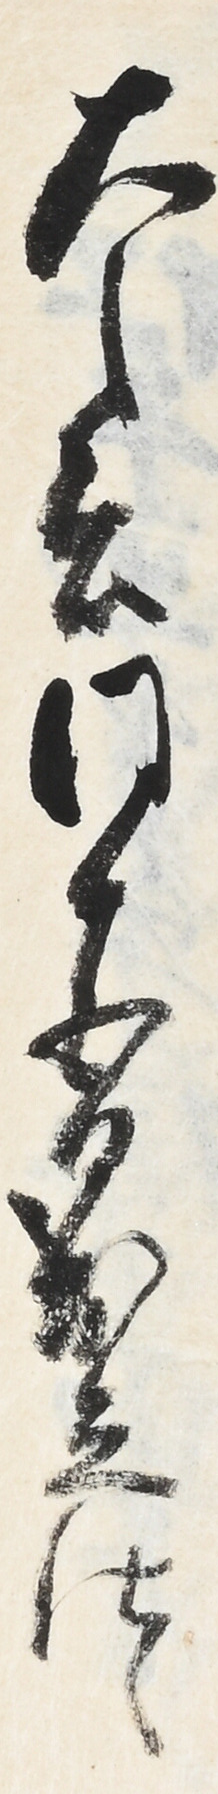右之者同十三日出立仕候
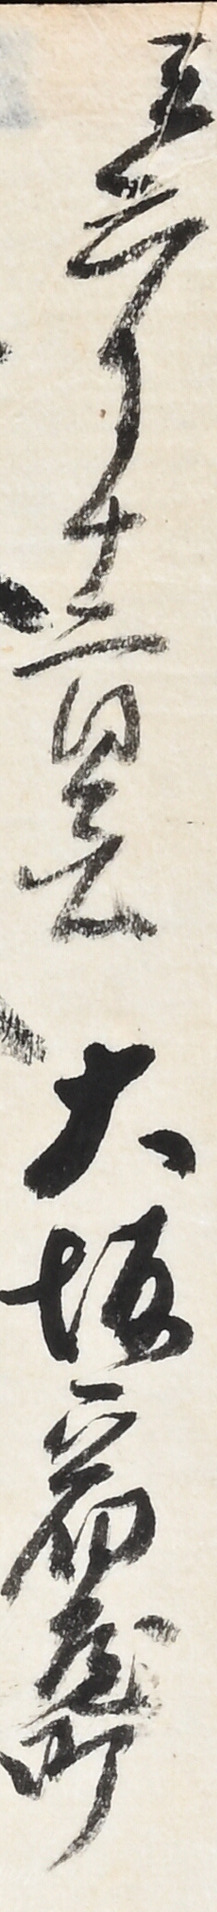壬六月十二日着大坂宿屋町
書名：旅人泊控帳
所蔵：伊那市立高遠町図書館・合同会社AMANE
